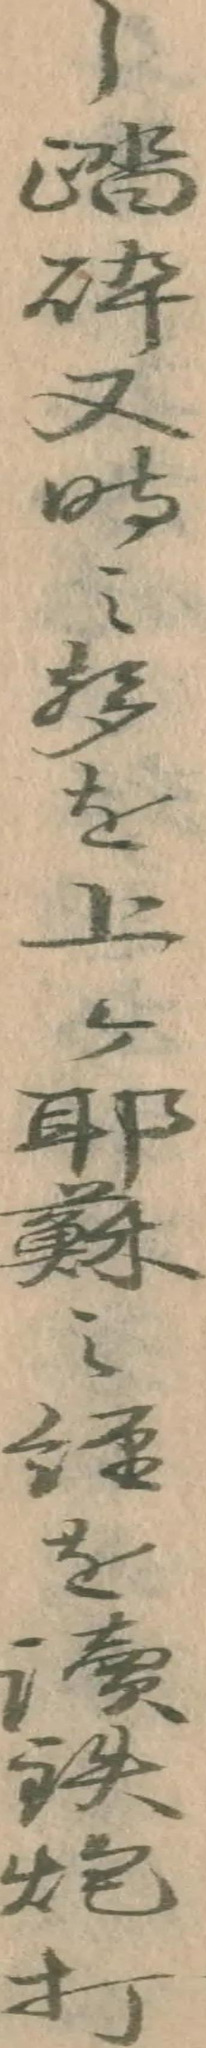し踏砕又時之声を上け耶蘇之経を読鉄炮打
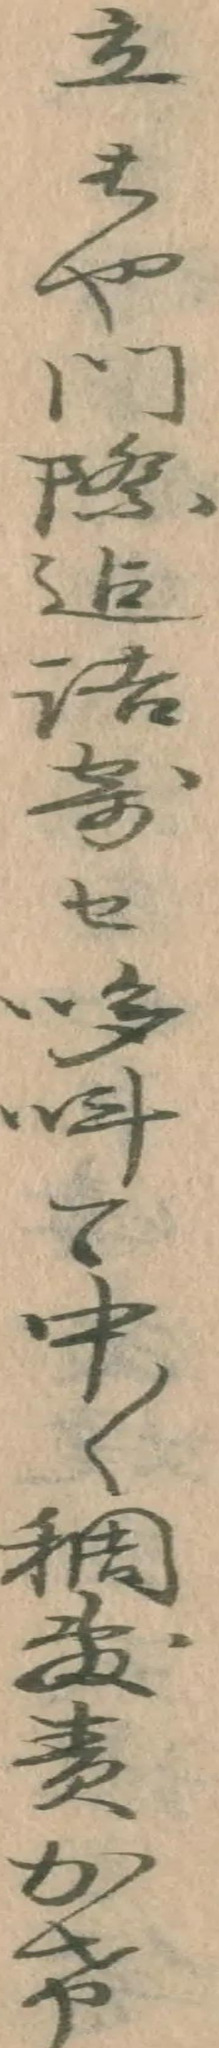立はや門際迄詰寄せ哆叫て中〱稠敷責かけ
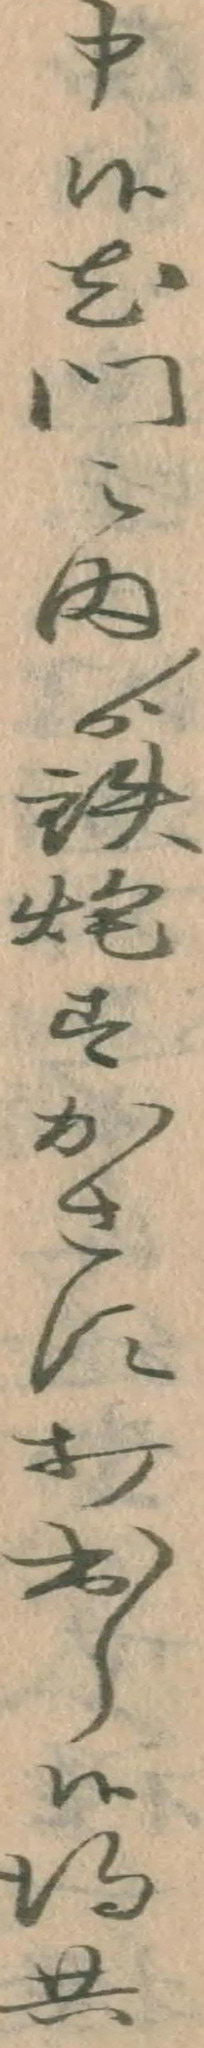申候尤門之内ゟ鉄炮すかさす打出し候得共
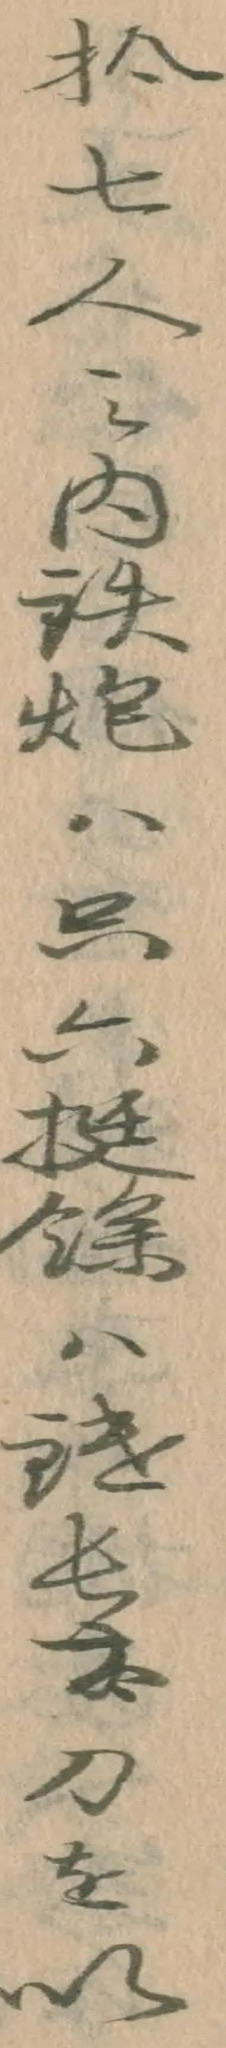拾七人之内鉄炮は只六挺余は鎗長太刀を以
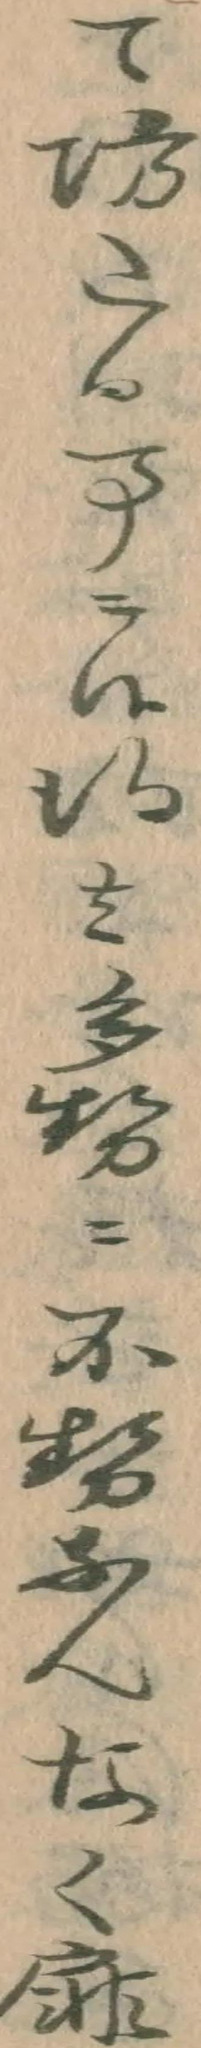て防たる事に候得は多勢に不勢なんなく扉
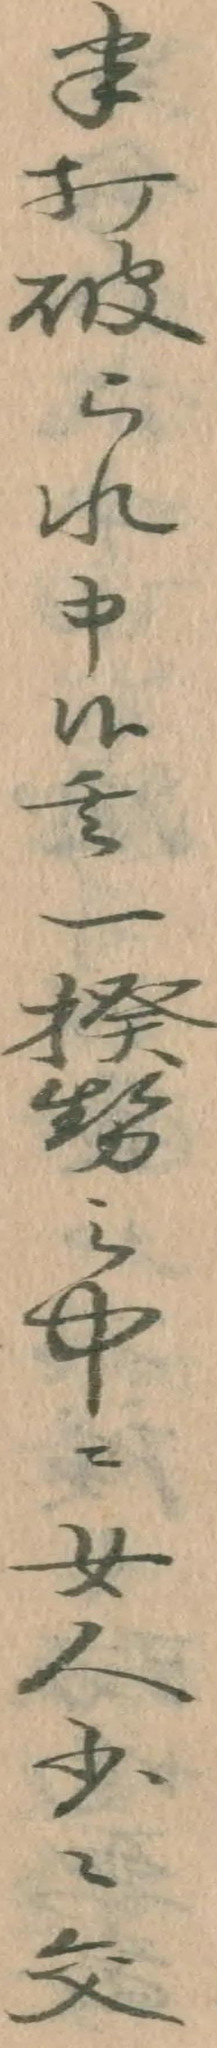半打破られ申候其一揆勢之中に女人少々交
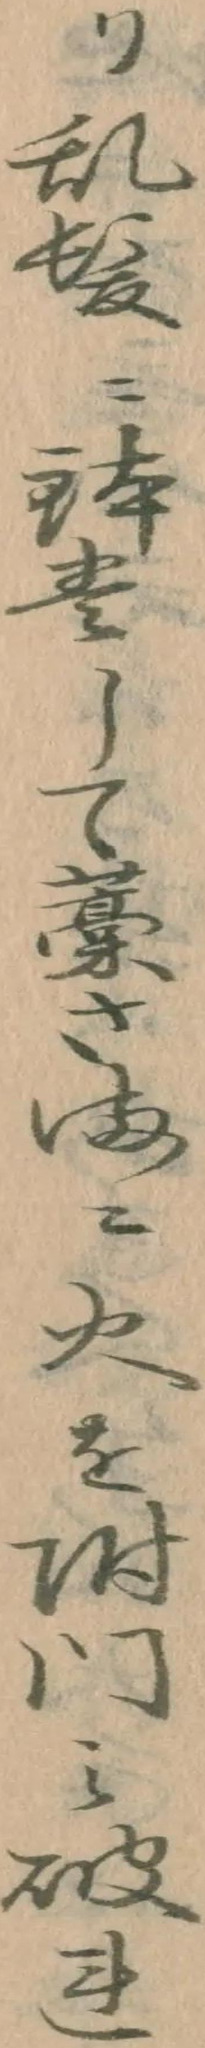り乱髪に鉢巻して藁さまに火を附門之破れ
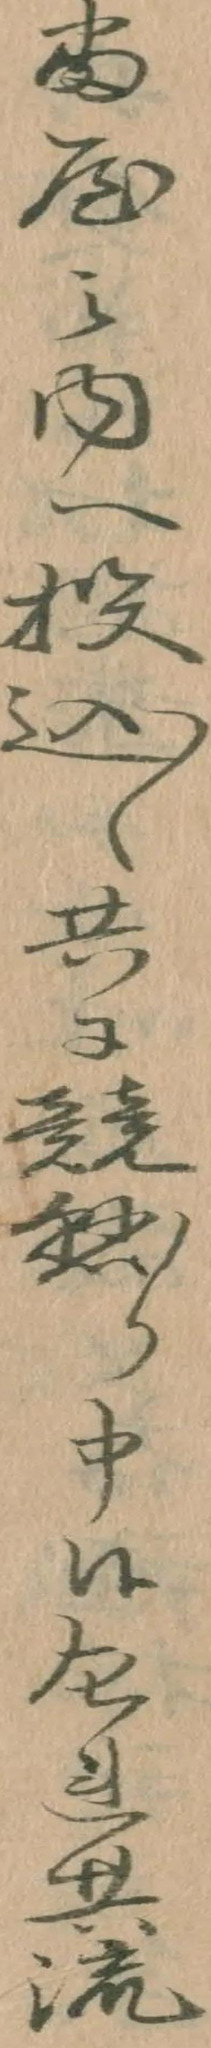番屋之内へ投込〱共に競懸り申候され共流
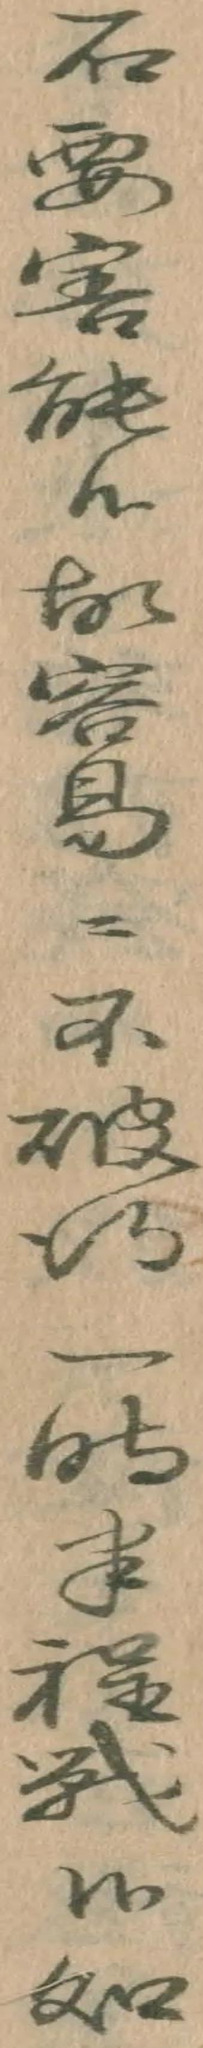石要害能候故容易に不破得一時半程戦候処
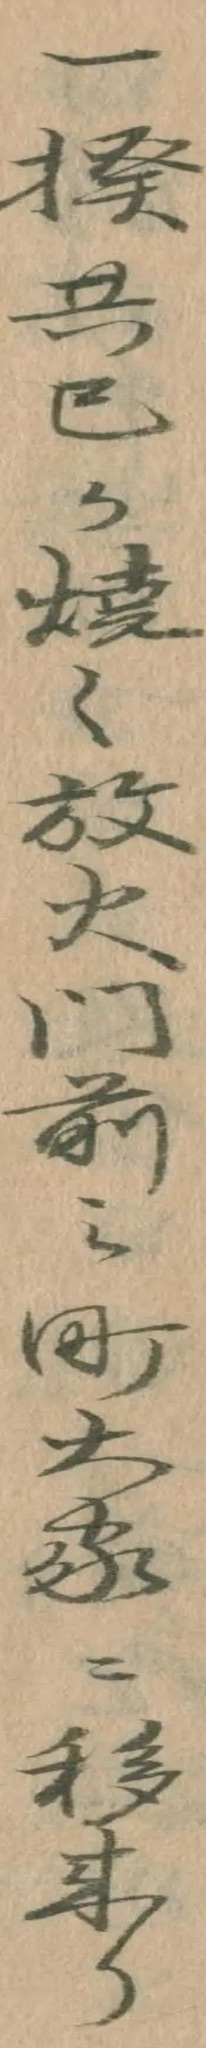一揆共己か焼く放火門前之町大家に移来り
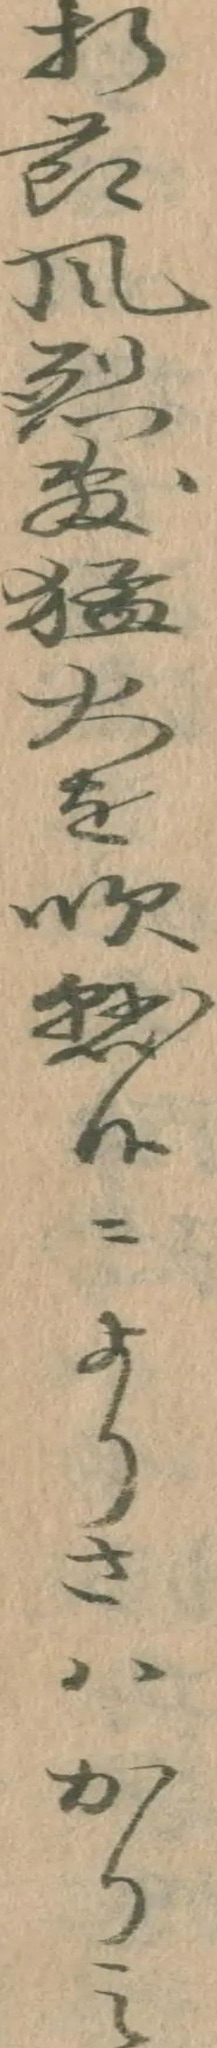折節風烈敷猛火を吹懸候によりさはかり之
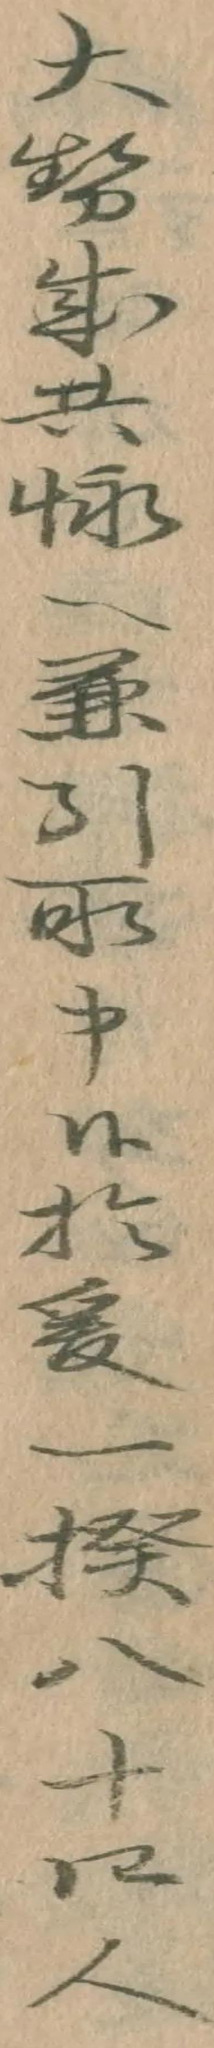大勢成共怺へ兼引取申候於爰一揆八十四人
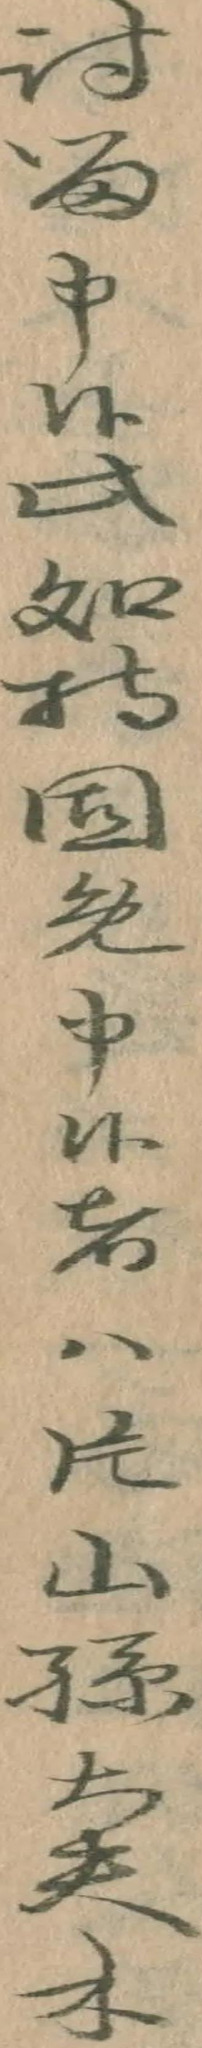討留申候此処持固め申候者は片山孫大夫木
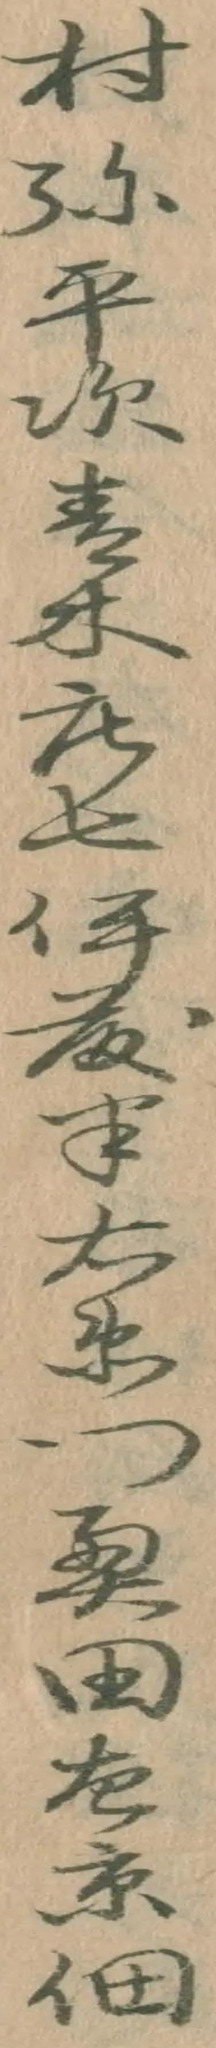村弥平次青木庄七伊藤半右衛門奥田左京佃
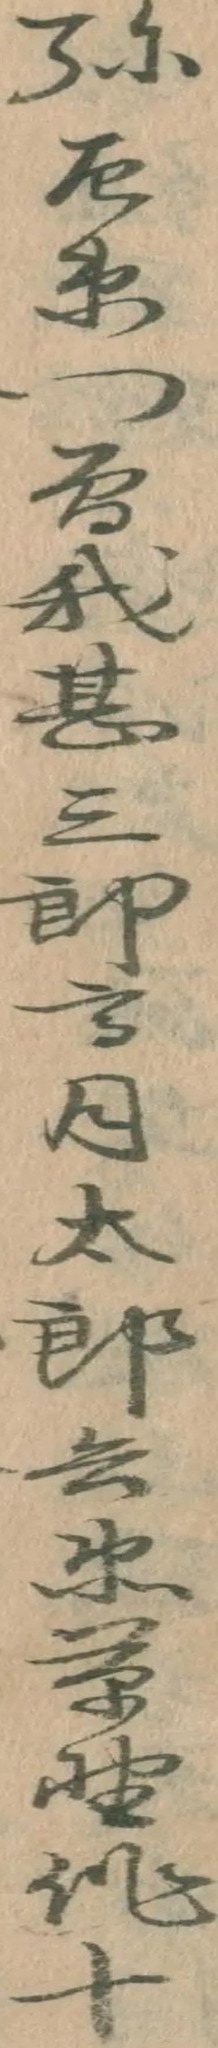弥左衛門曽我甚三郎高月太郎兵衛草野作十
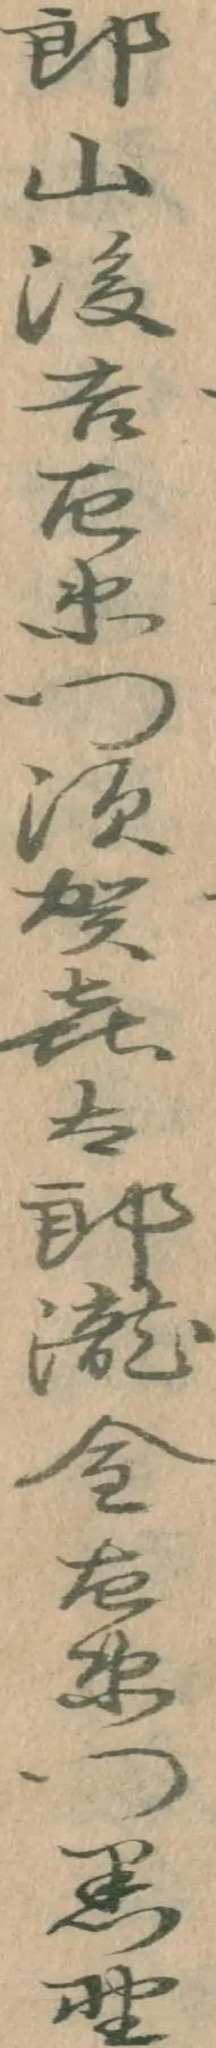郎山後吉左衛門須賀喜太郎瀧金左衛門黒野
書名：切支丹御退治記 49巻. [1]
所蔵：国立国会図書館 National Diet Library, JAPAN
